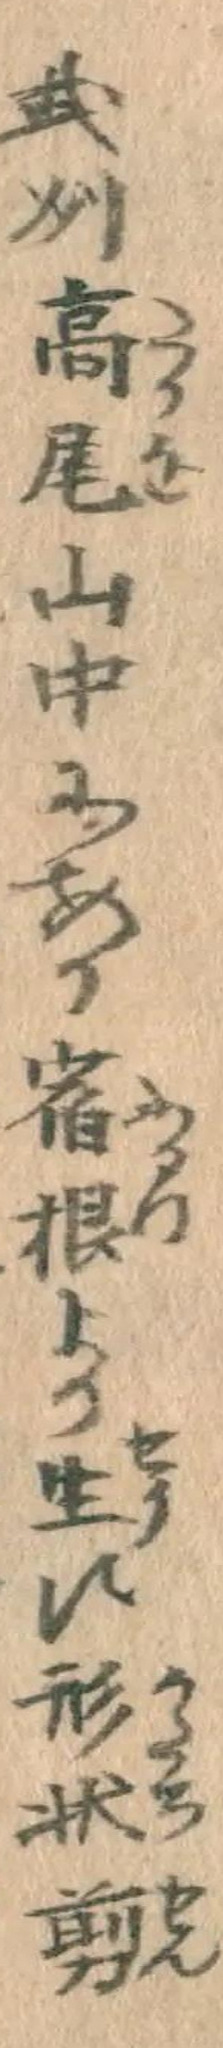武州高尾山中にあり宿根より生す形状剪
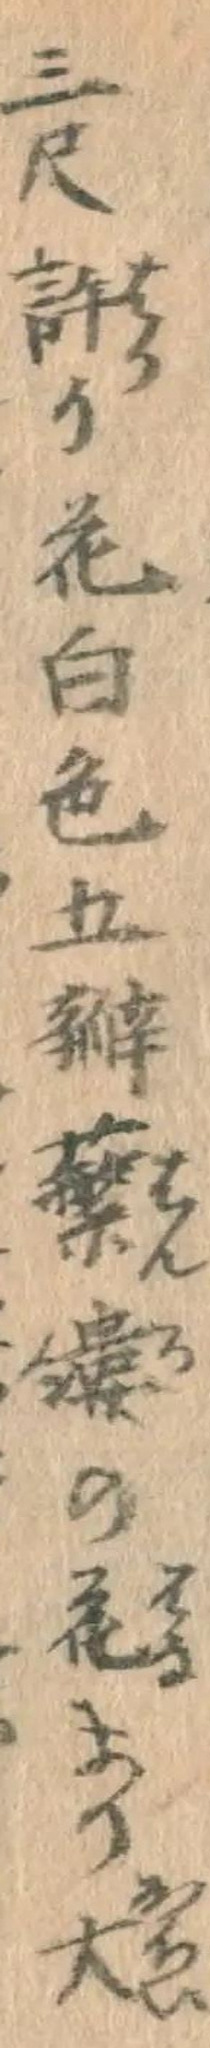三尺許り花白色五弁蘩縷の花より大
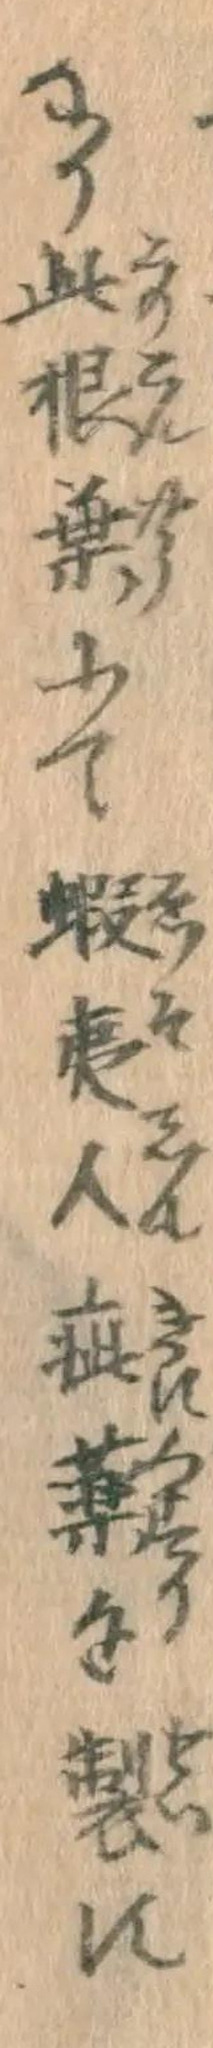なり此根葉にて蝦夷人疵薬を製す
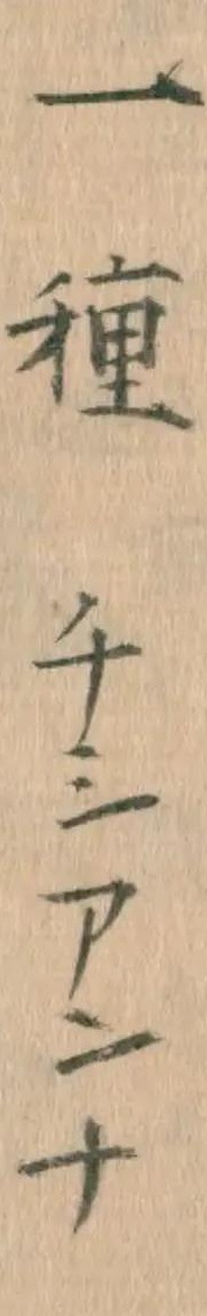一種チシアンナ
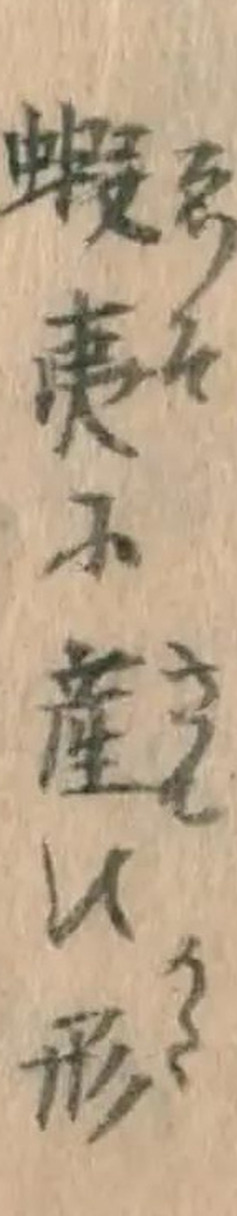蝦夷に産す形
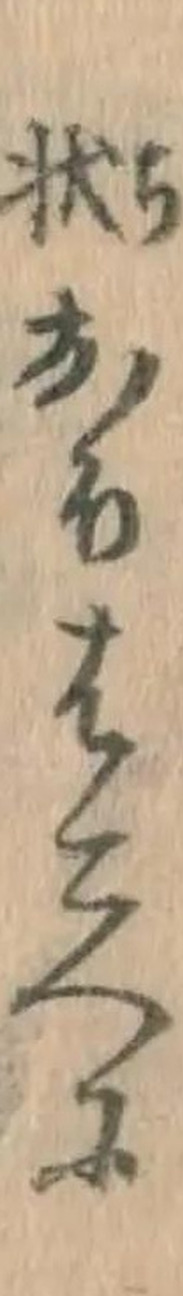状おほはこへに
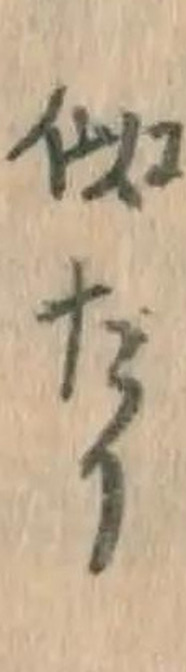似たり

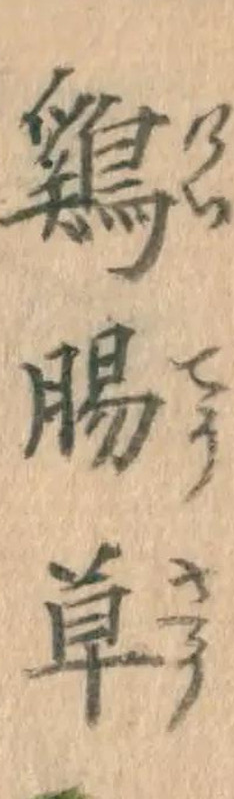鶏腸草
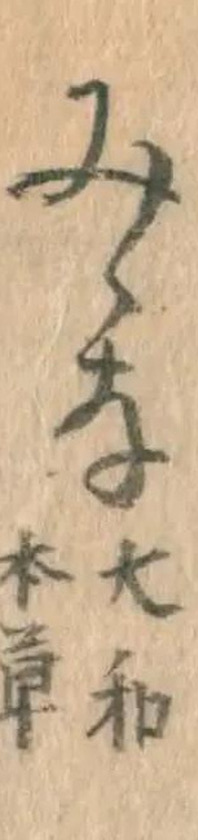みゝなくさ
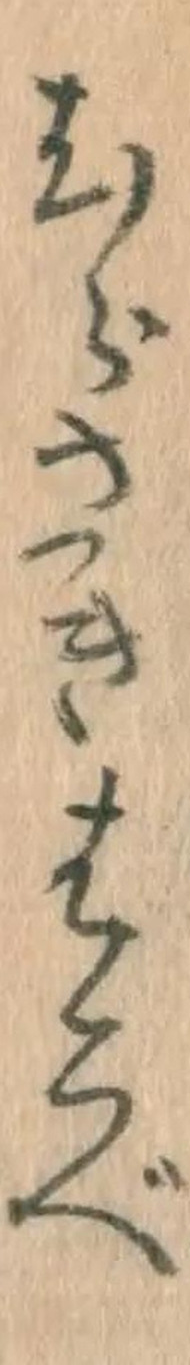むらさきはこべ
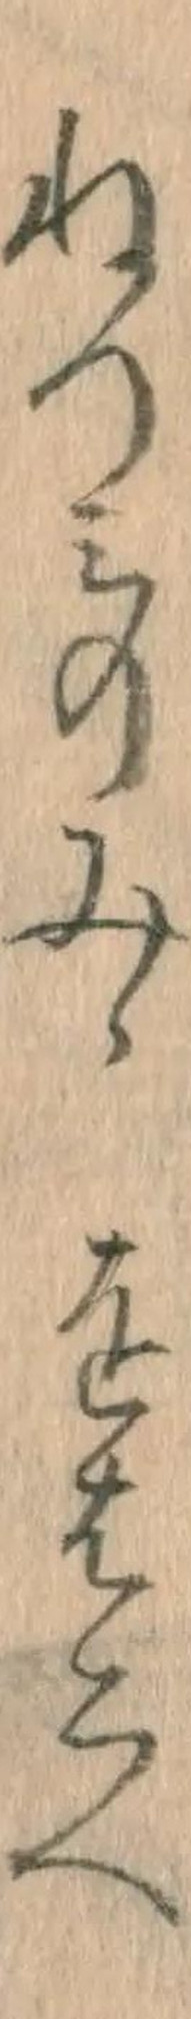ねつみのみゝをはこへ
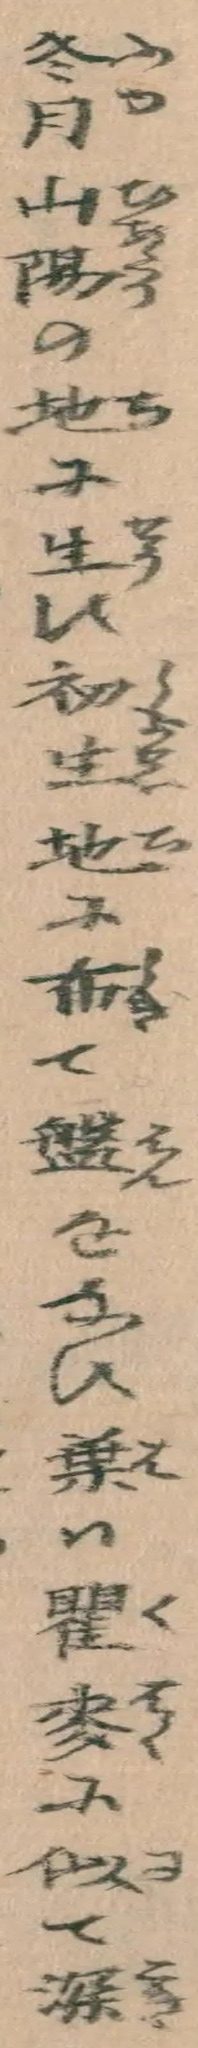冬月山陽の地に生す初生地に布て盤をなす葉は瞿麦に似て深
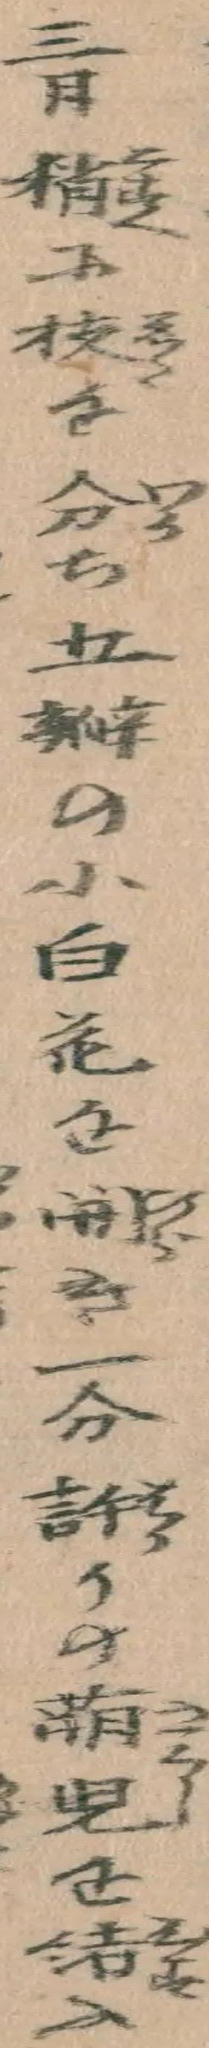三月梢に枝を分ち五弁の小白花を開き一分許りの蒴児を結ふ
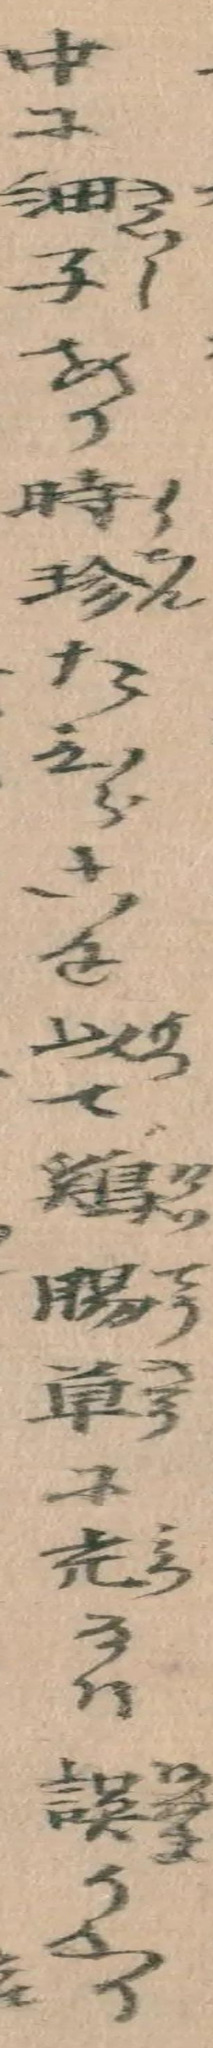中に細子あり時珍たひらこを以て鶏腸草に充るは誤りなり
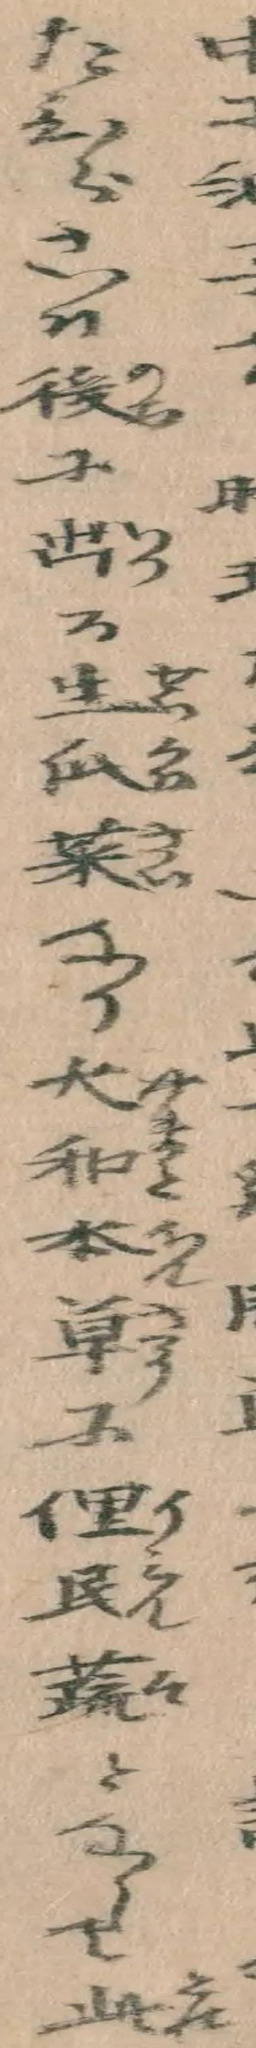たひらこは後に出る生瓜菜なり大和本草に俚民蔬となして此
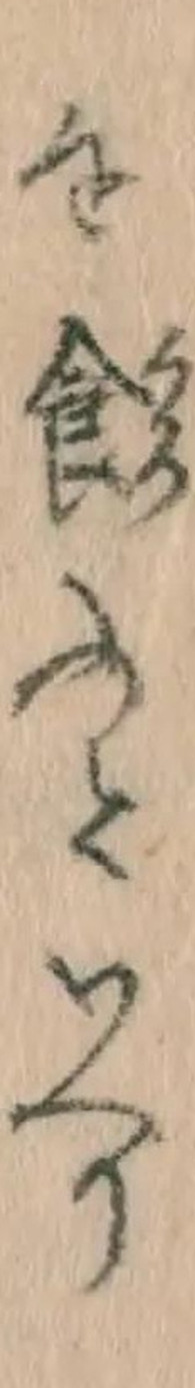を食ふといへり
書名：本草図譜. 巻46-48
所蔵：国立国会図書館 National Diet Library, JAPAN
